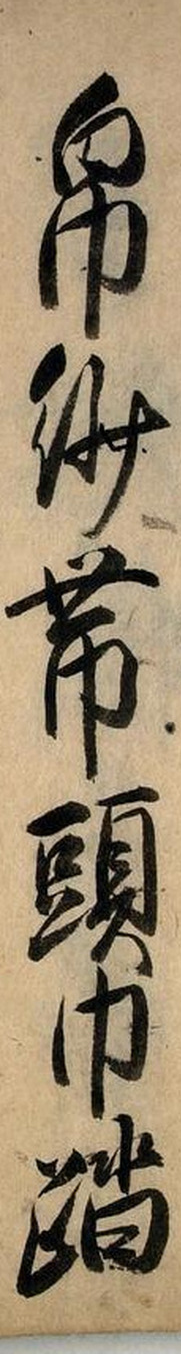帛紗帯頭巾踏
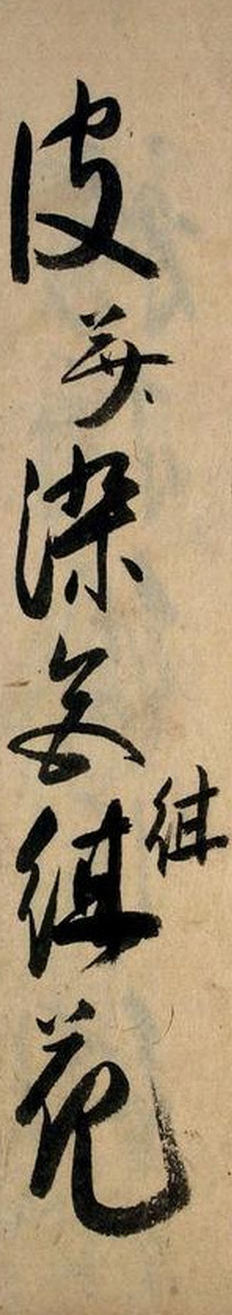皮并染色紺花
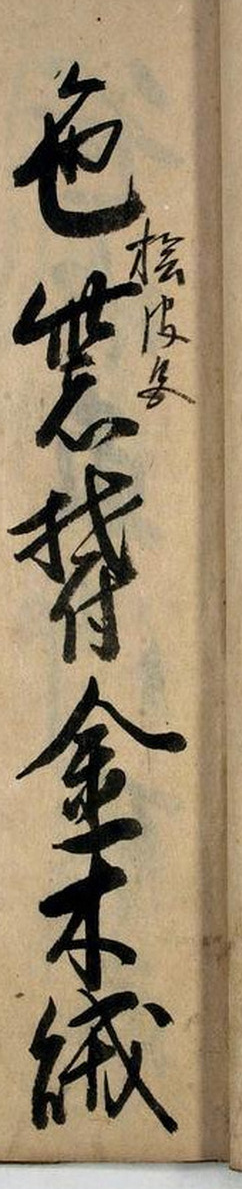色紫鬱金木賊
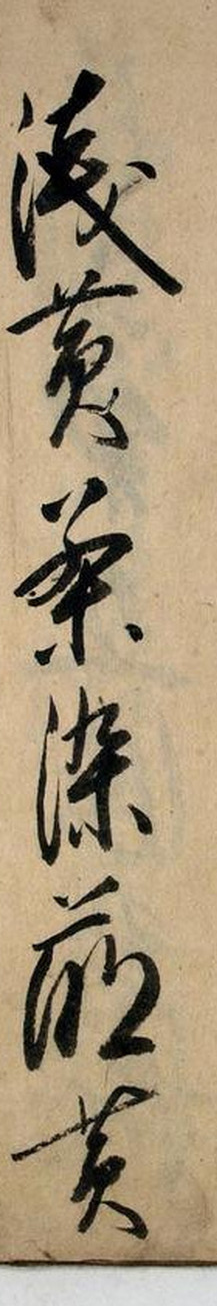浅黄茶染萌黄
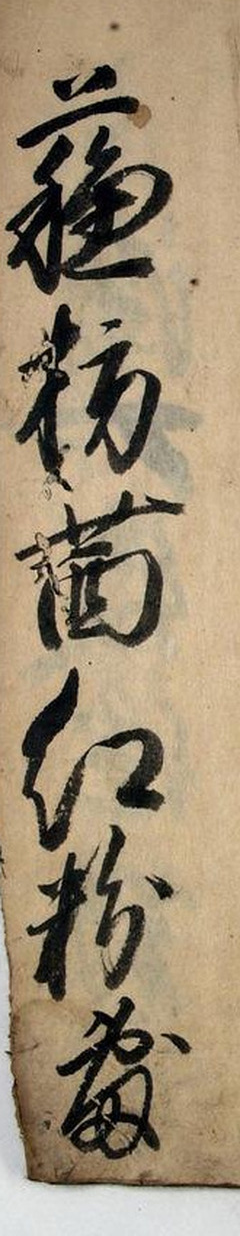蘇枋茜紅粉処

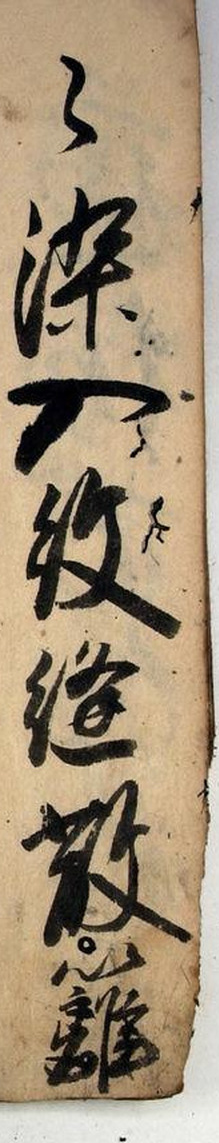々染入紋縫散。籬
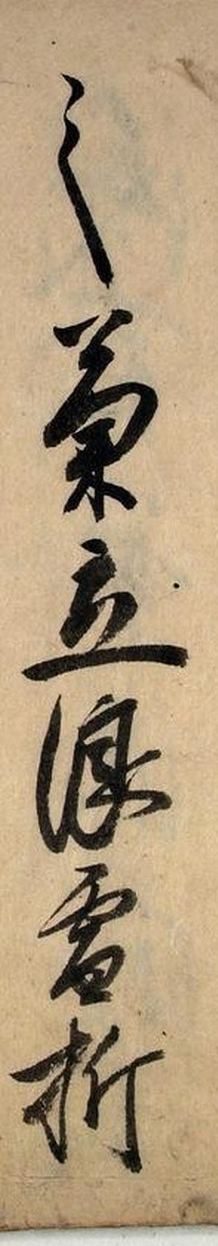之菊立浪雪折
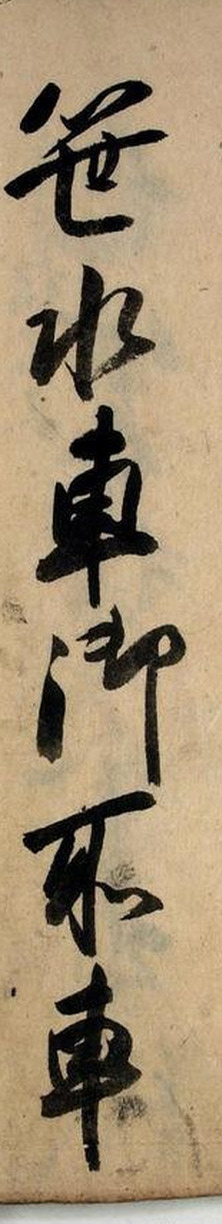笹水車御所車
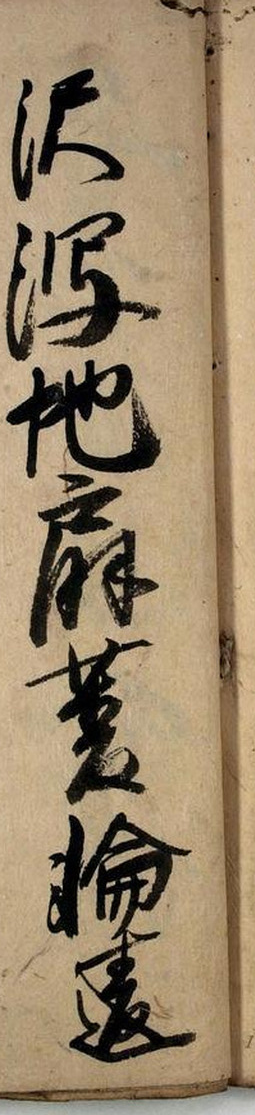沢瀉地扇菱輪違
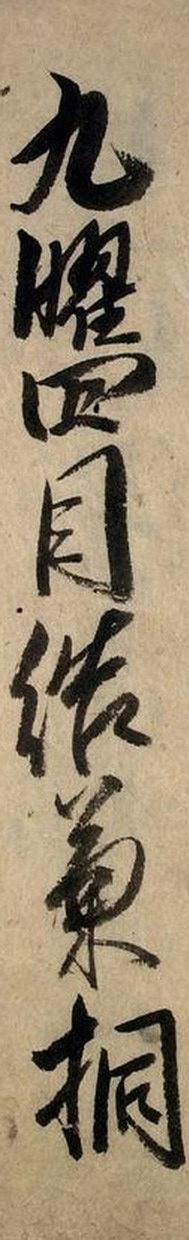九曜四目結菊桐
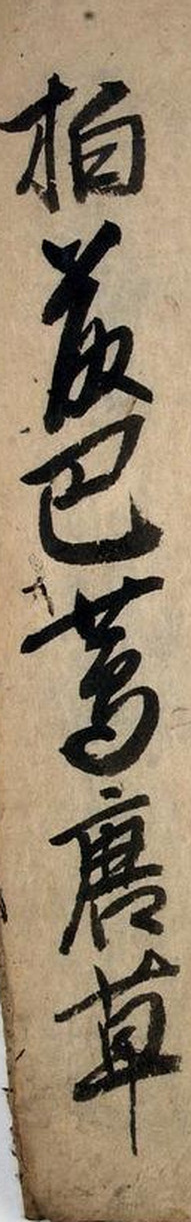柏藤巴蔦唐草

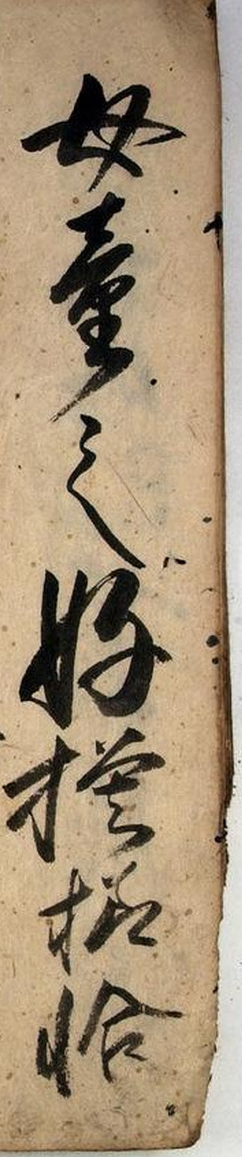女童之好模様恰
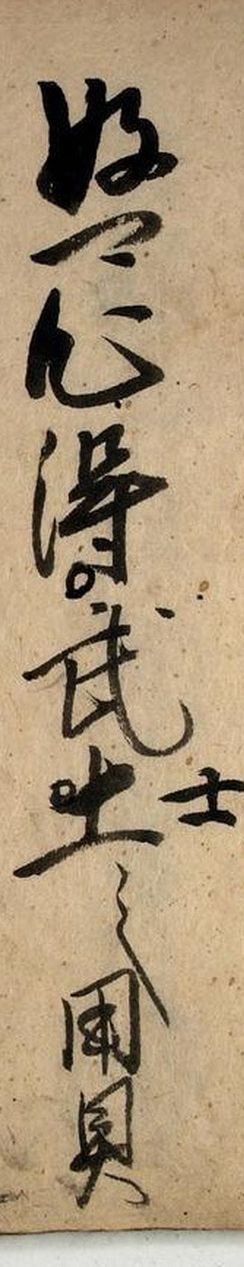好可心得。武土之用具
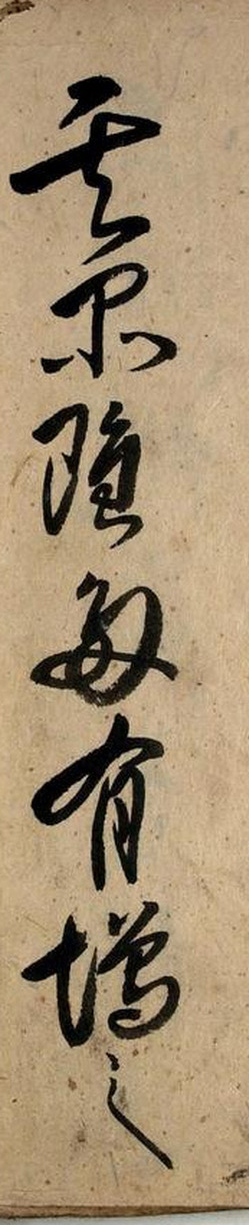其品雖多有増之
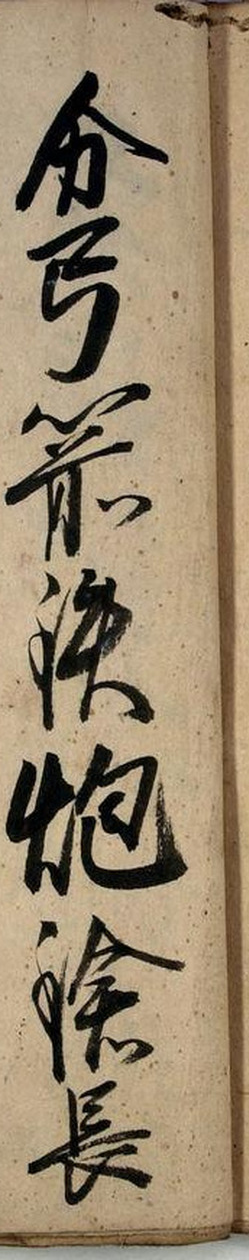分弓箭鉄砲槍長
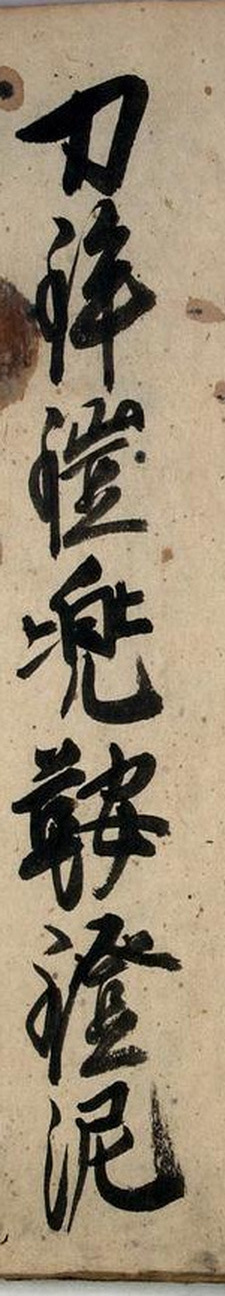刀鉾鎧兜鞍鐙泥
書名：商売往来（往来物、手習、市之助・市兵衛の名もあり）
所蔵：福井県文書館 Fukui Prefectural Archives
